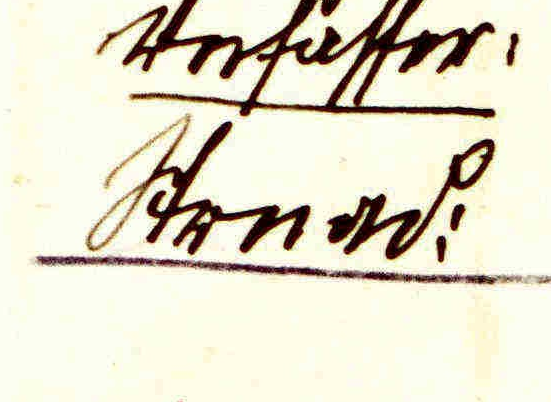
Strnad:
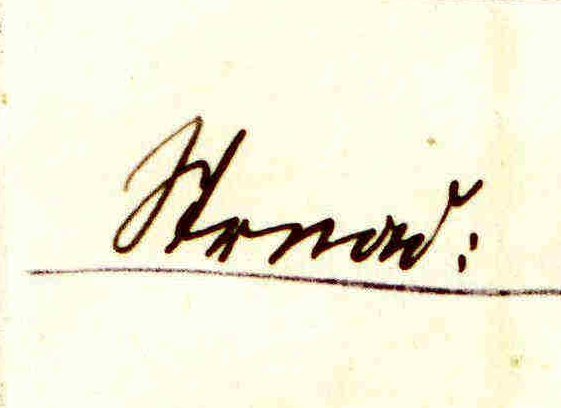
Strnad:
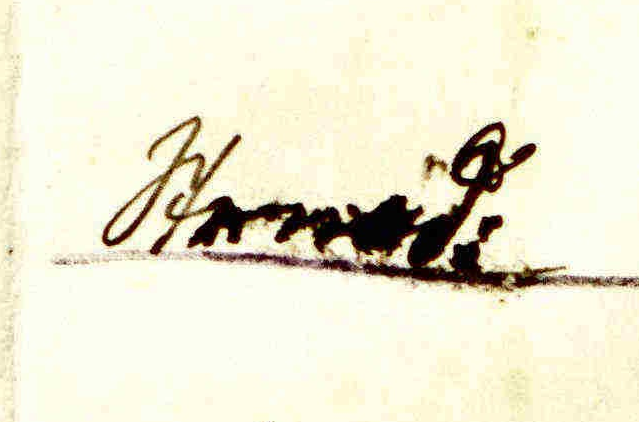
Strnad:
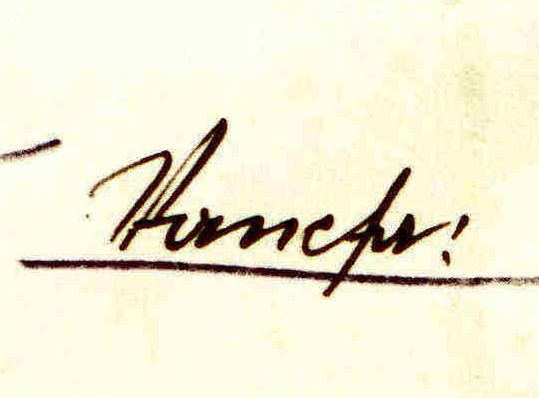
Vanesa:
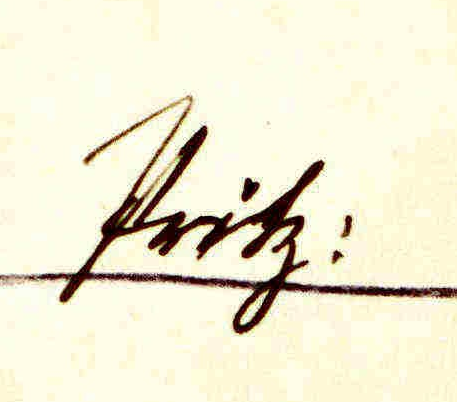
Pritz:
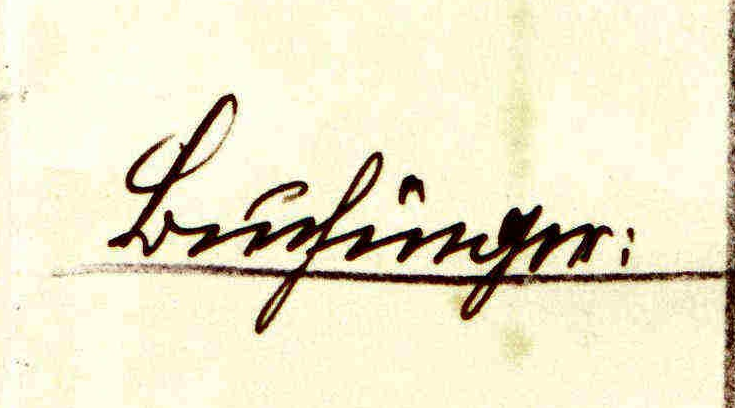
Buchinger:
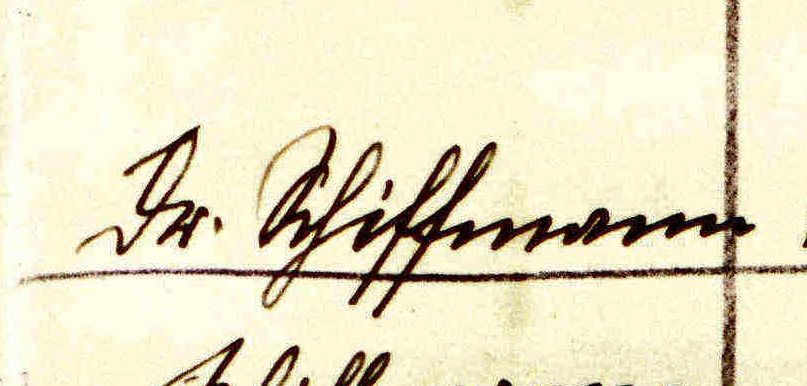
Dr. Schiffmann
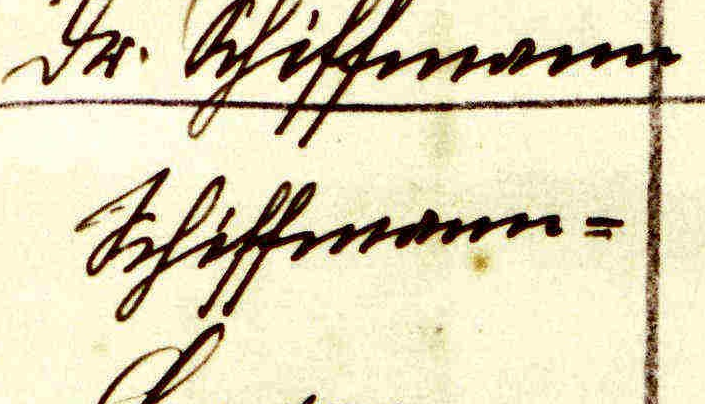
Schiffmann-
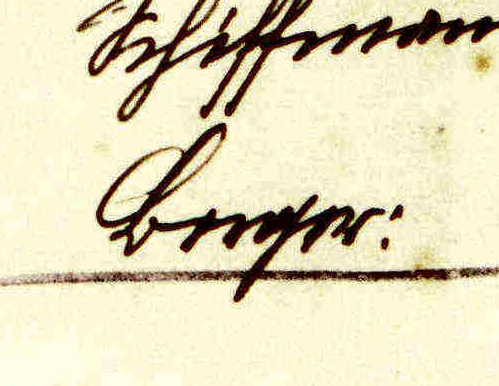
berger:
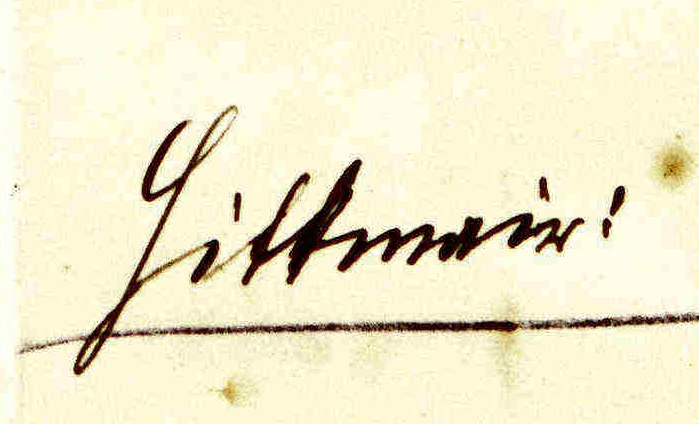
Hittmair:
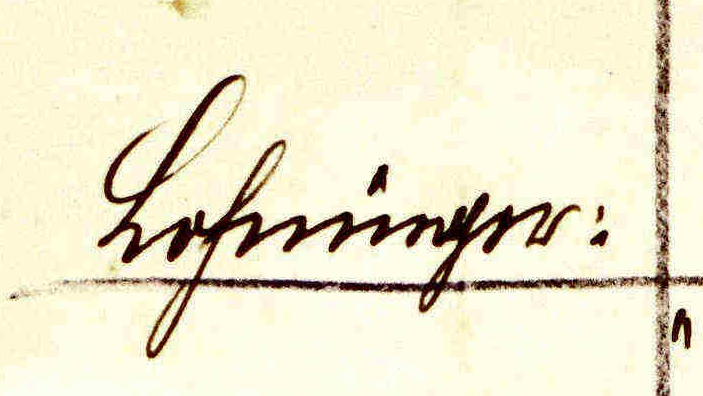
Lohninger:
